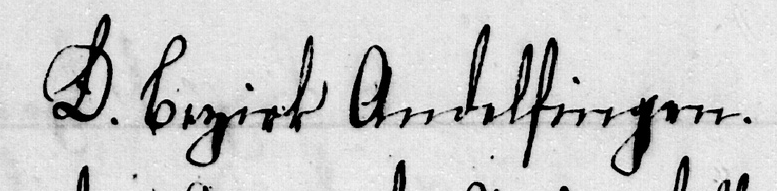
D. Bezirk Andelfingen.
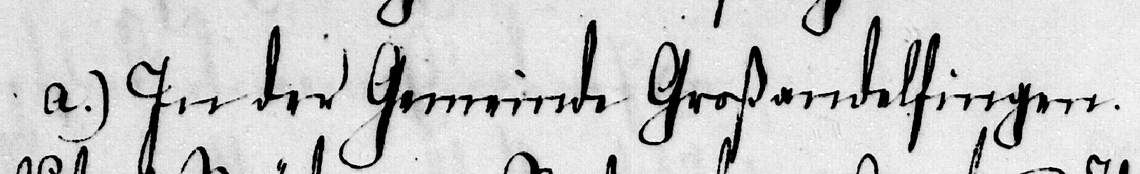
a.) In der Gemeinde Großandelfingen.
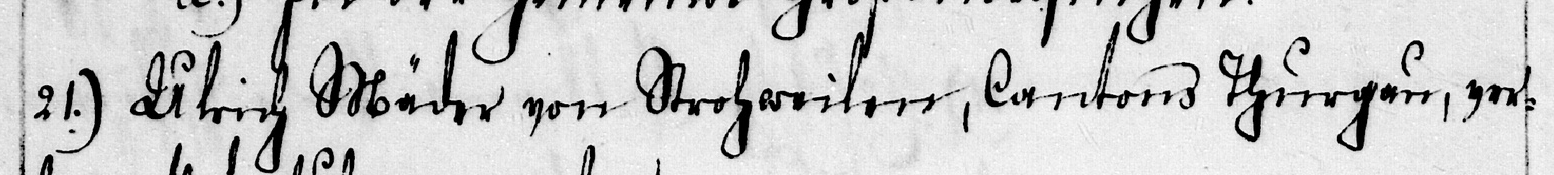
21.) Ulrich Mäder von Strohweilen, Cantons Thurgau, ver¬
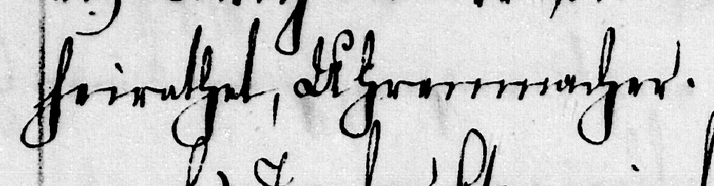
heirathet, Uhrenmacher.
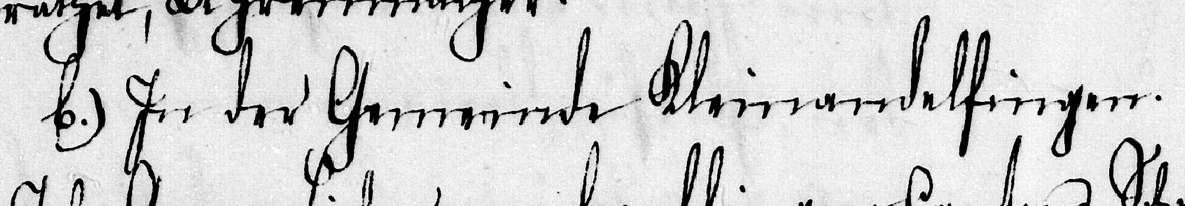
b.) In der Gemeinde Kleinandelfingen.
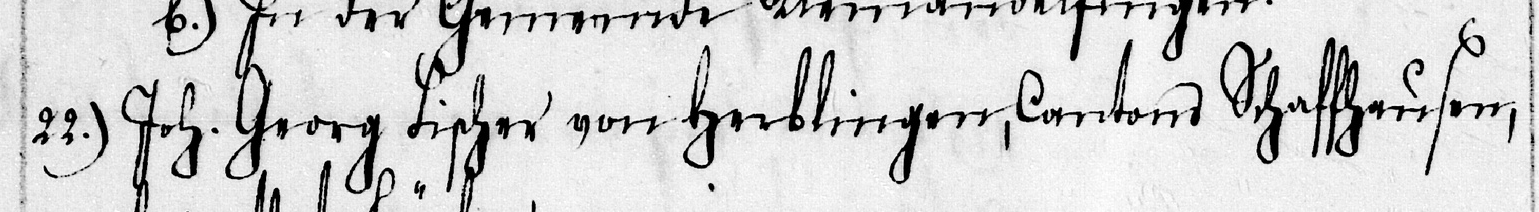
22.) Joh. Georg Fischer von Herblingen, Cantons Schaffhausen,
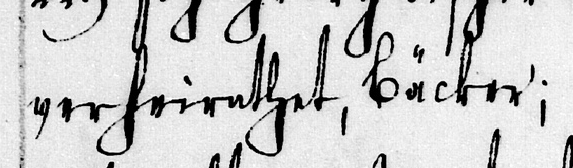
verheirathet, Bäcker;
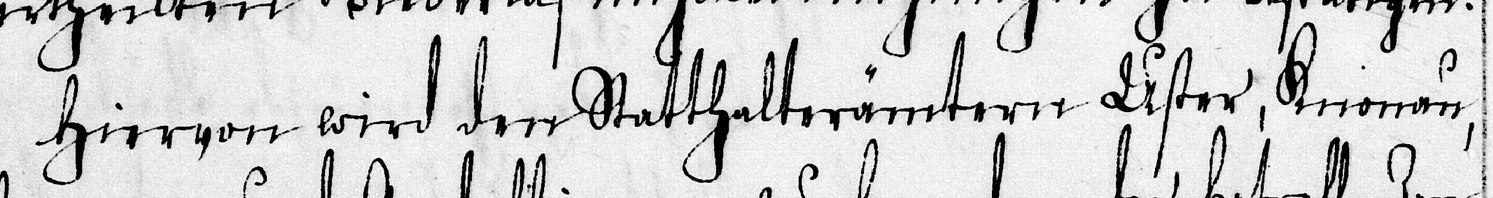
Hiervon wird den Statthalterämtern Uster, Knonau,
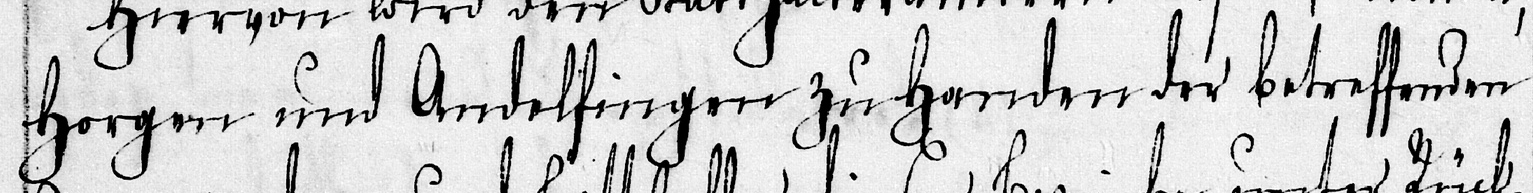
Horgen und Andelfingen zu Handen der betreffenden
